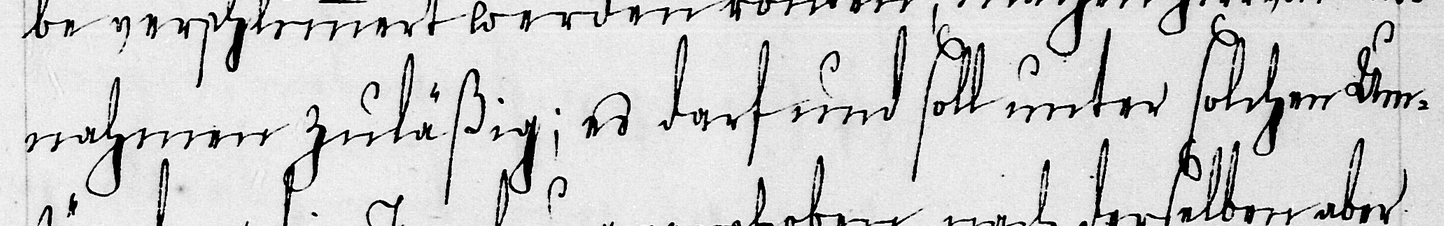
nahmen zuläßig; es darf und soll unter solchen Um¬
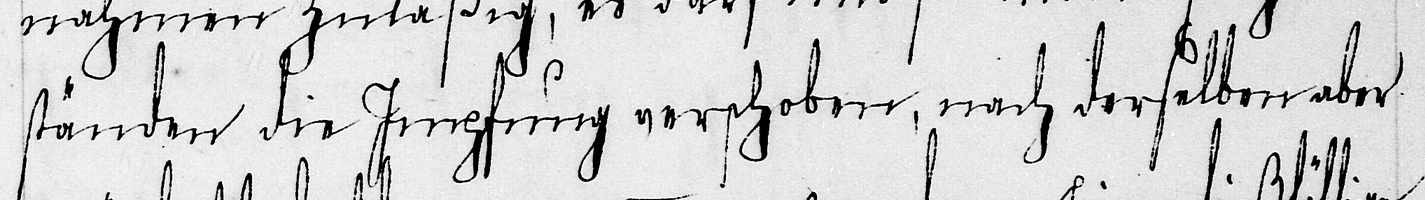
ständen die Impfung verschoben, nach derselben aber
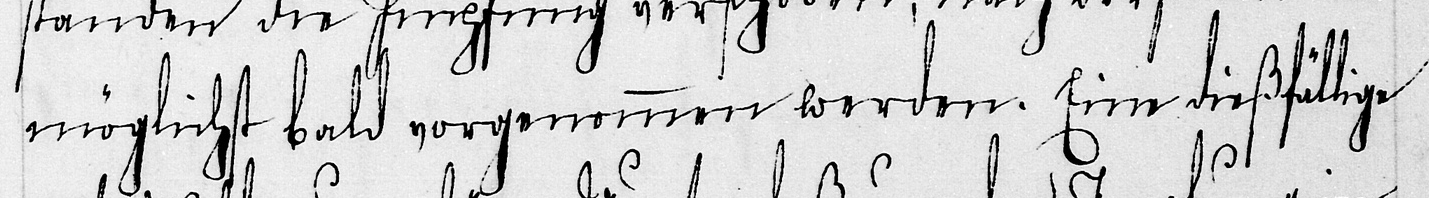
möglichst bald vorgenommen werden. Eine dießfällige
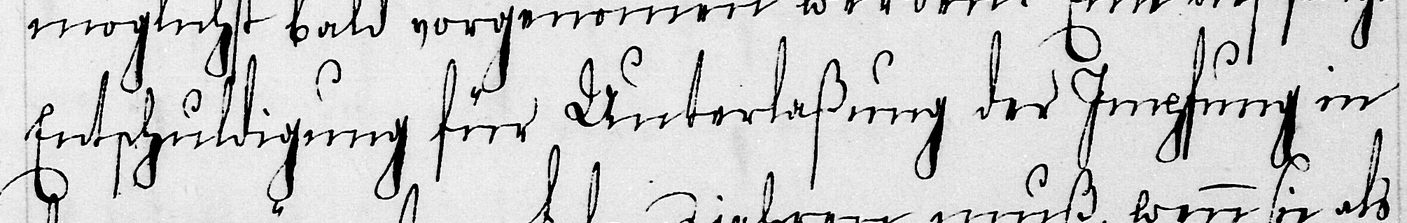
Entschuldigung für Unterlaßung der Impfung in
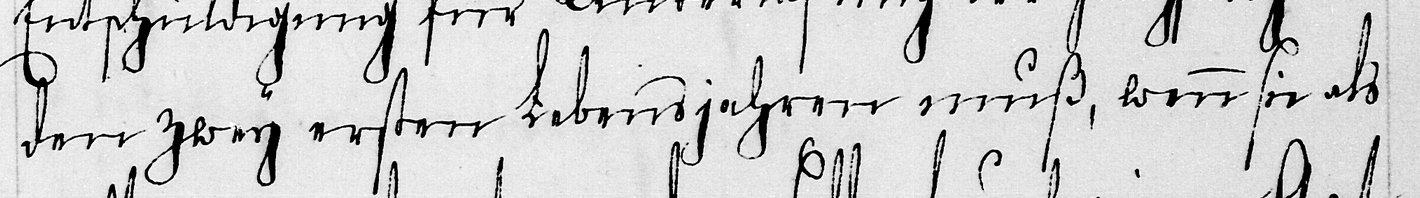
den zwey ersten Lebensjahren muß, wenn sie als
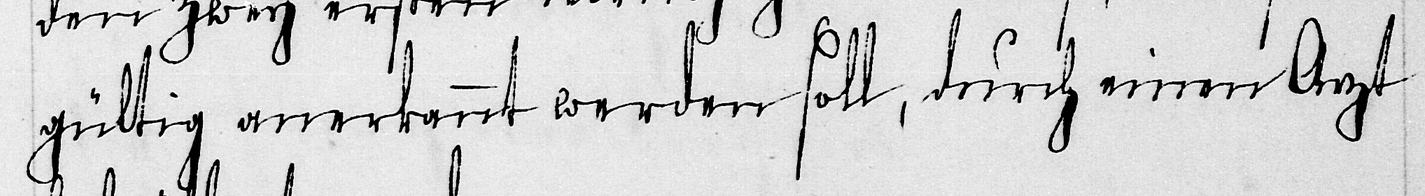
gültig anerkannt werden soll, durch einen Arzt
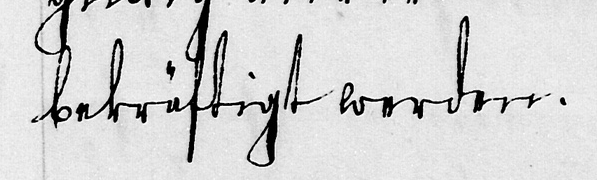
bekräftigt werden.
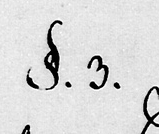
§. 3.
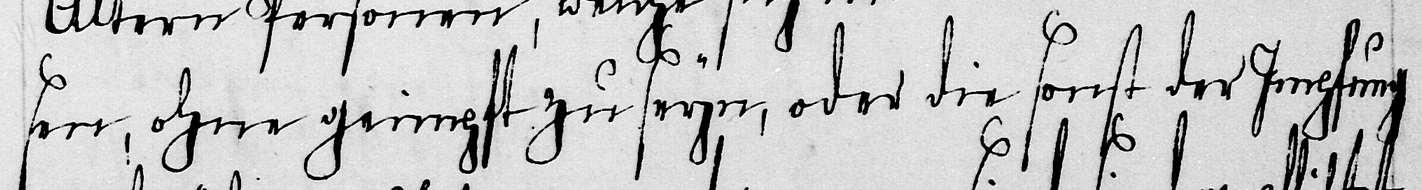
en, ohne geimpft zu seyn, oder die sonst der Impfung
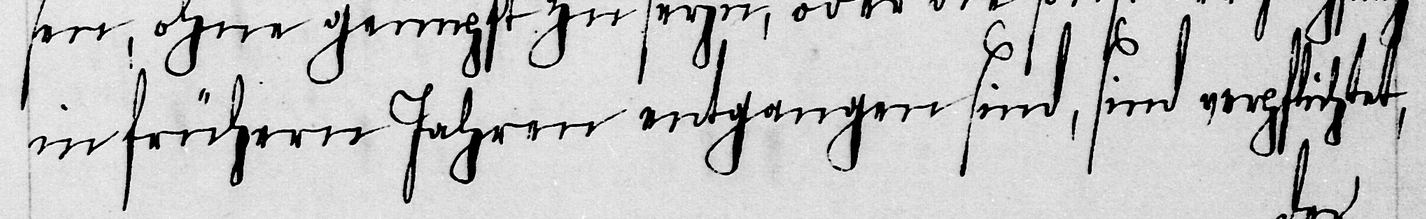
in frühern Jahren entgangen sind, sind verpflich¬
